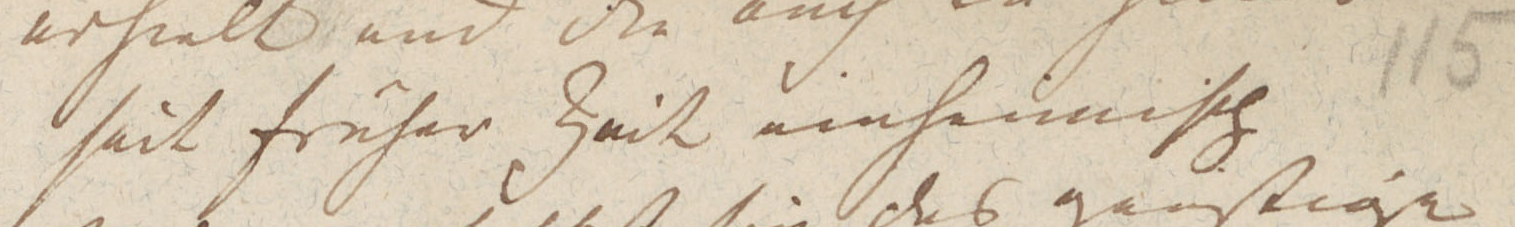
seit früher Zeit einheimisch
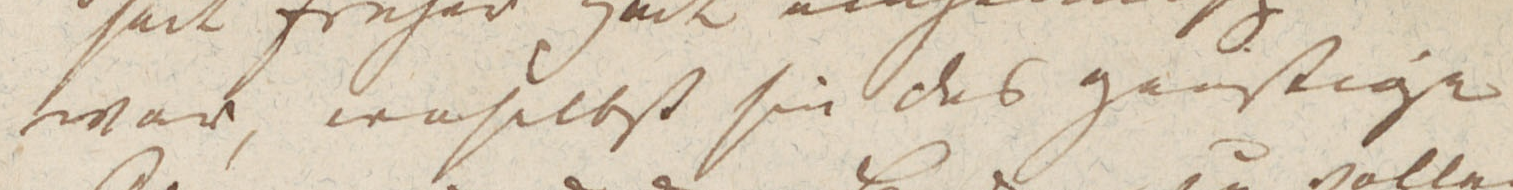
war, woselbst sie das günstige
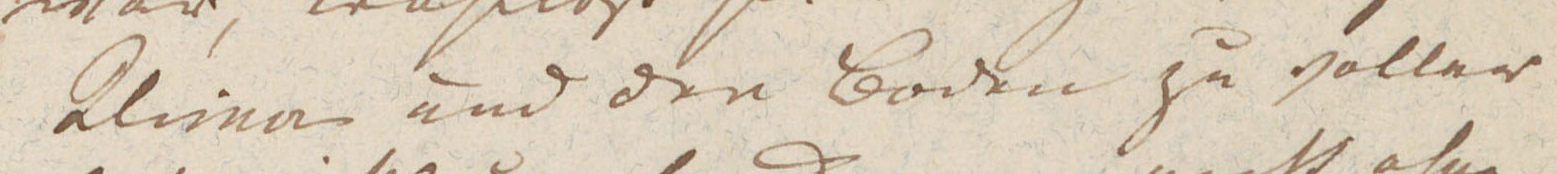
Klima und den Boden zu voller
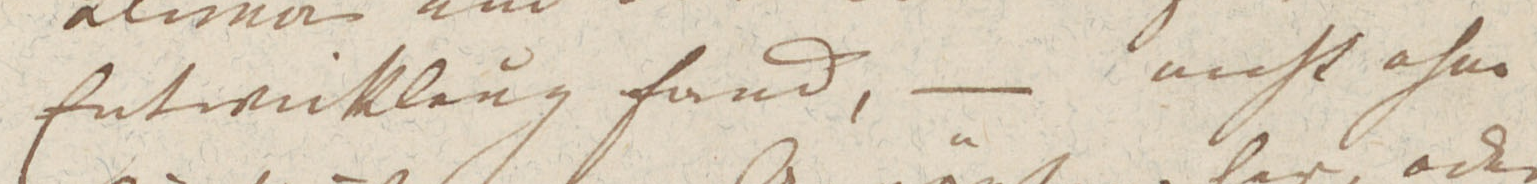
Entwicklung fand, – nicht ohne
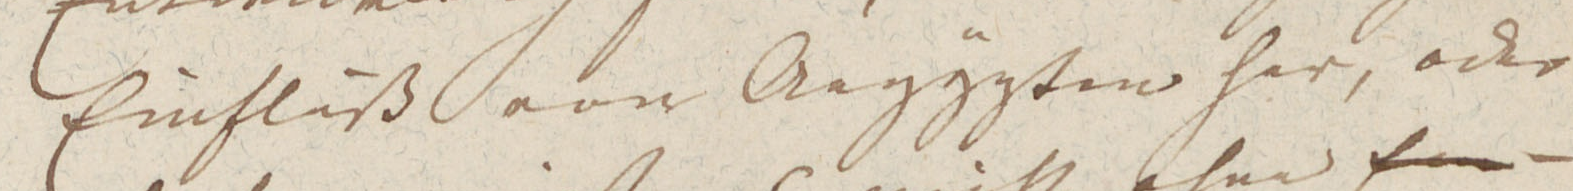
Einfluss von Aegypten her, oder
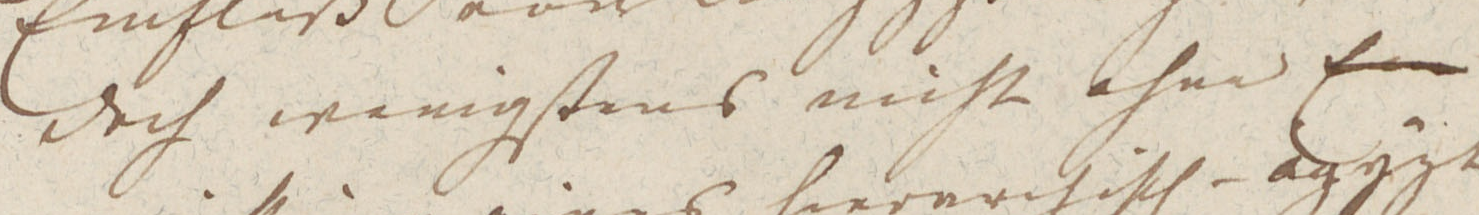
doch wenigstens nicht ohne Ein-
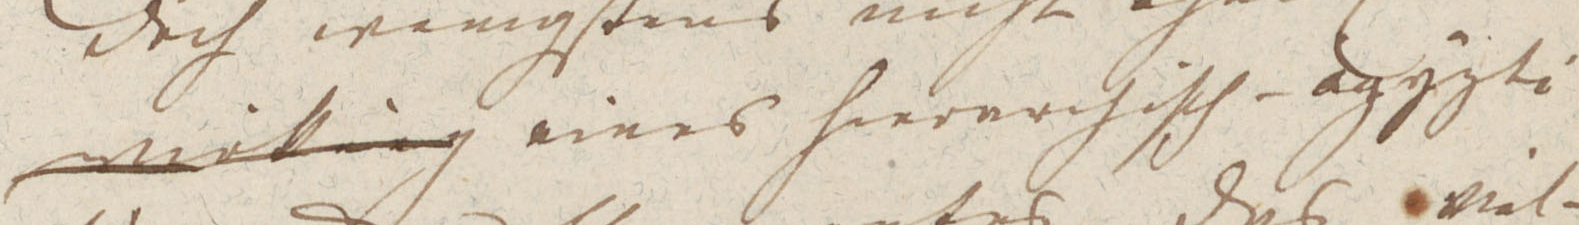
wirkung eines hierarchisch-ägypti
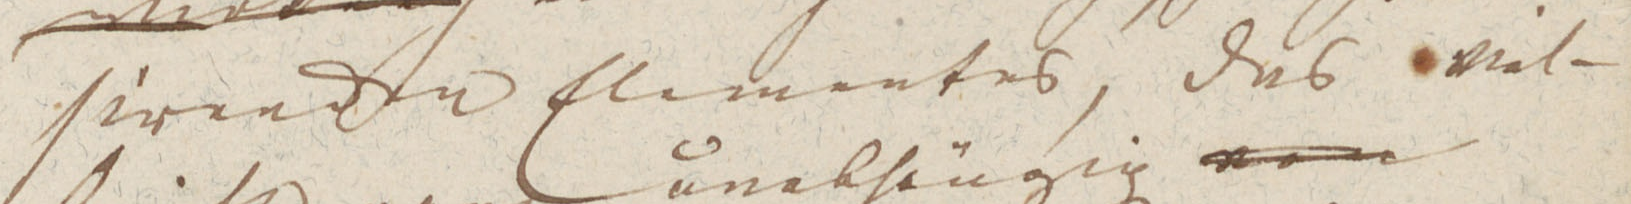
sirenden Elementes, das viel-
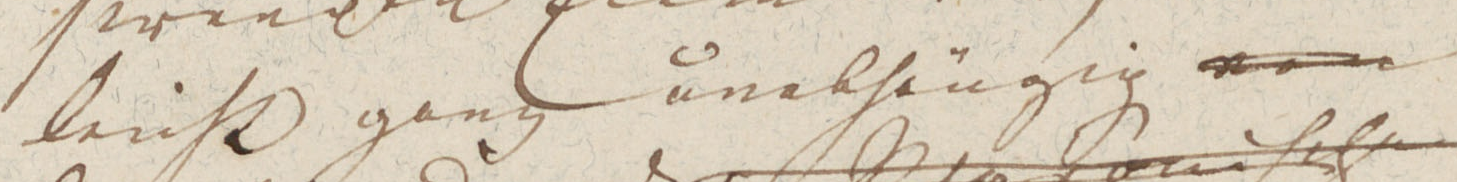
leicht ganz unabhängig von
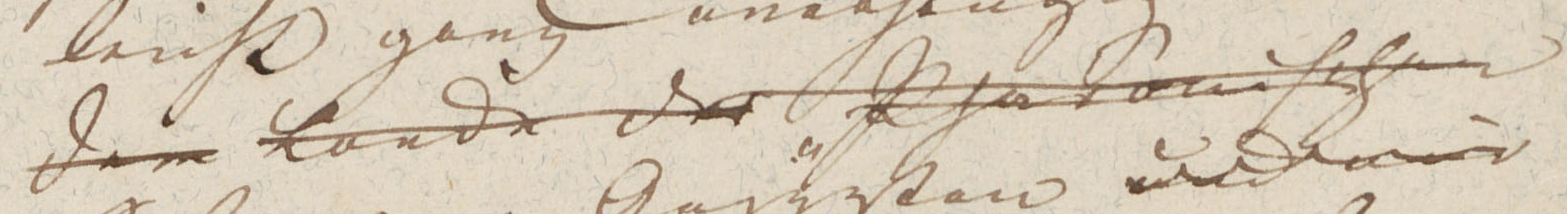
dem Lande der Pharonischen
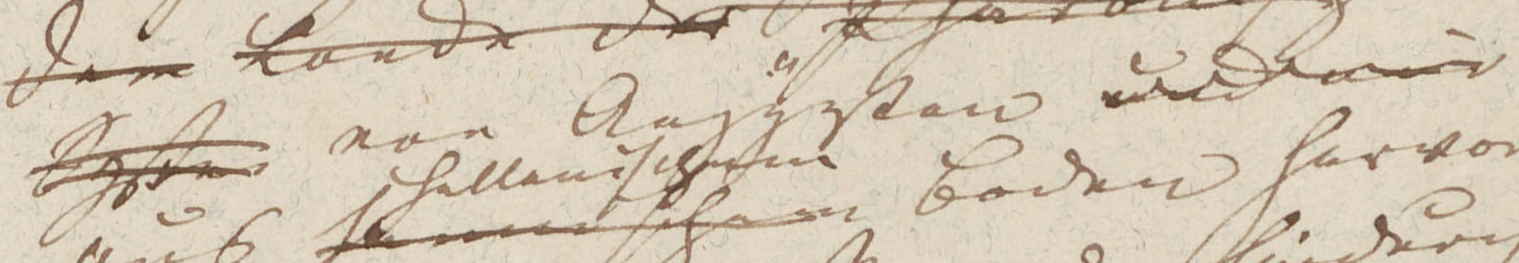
Syste von Aegypten und nur
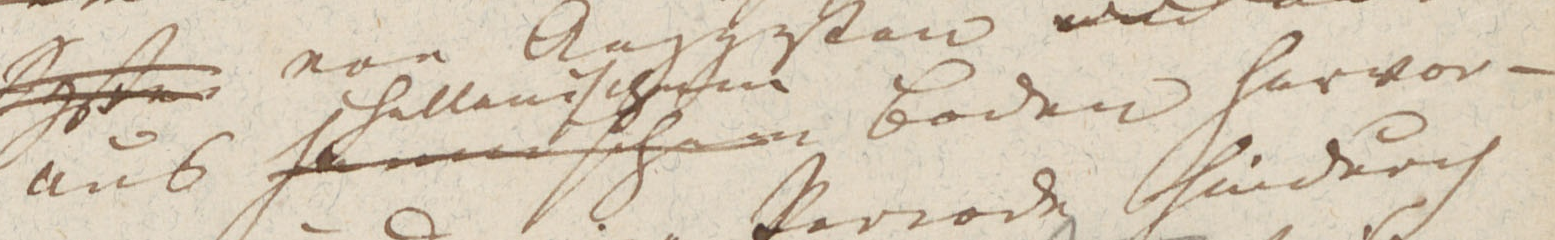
aus heimischem hellenischem Boden hervor-
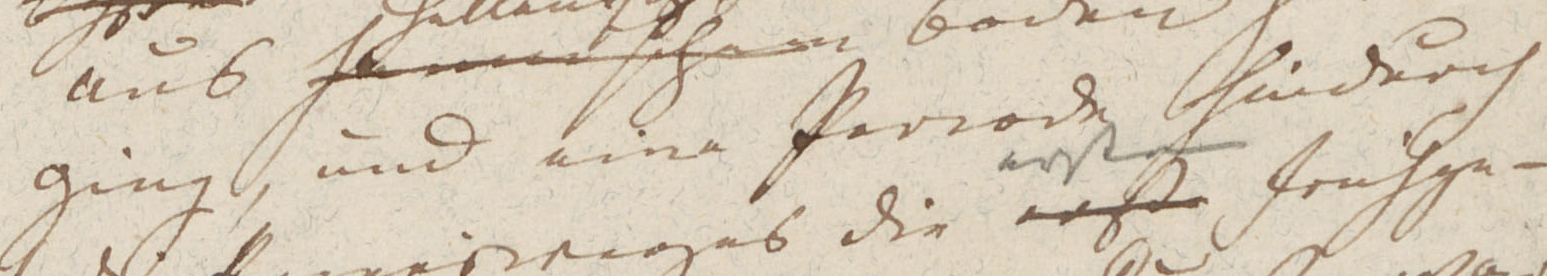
ging, und eine Periode hindurch
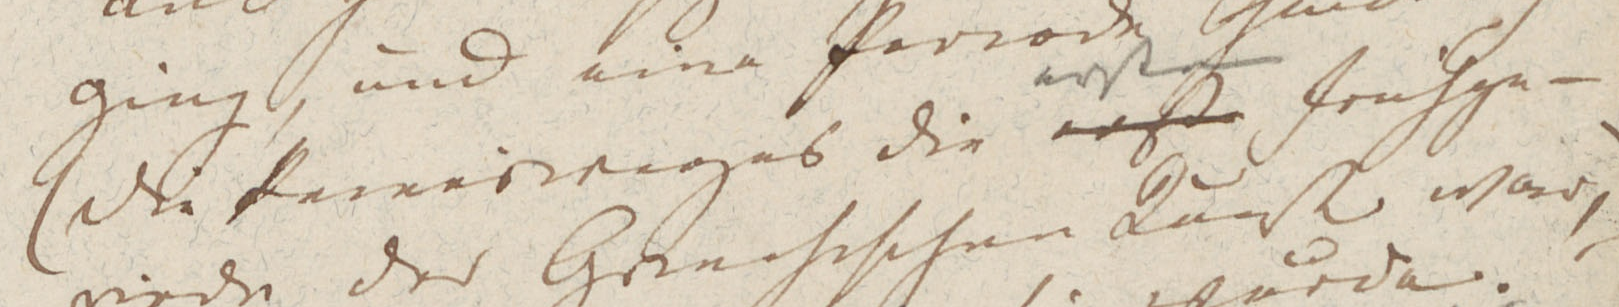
(die keinesweges die erste erste Frühpe-
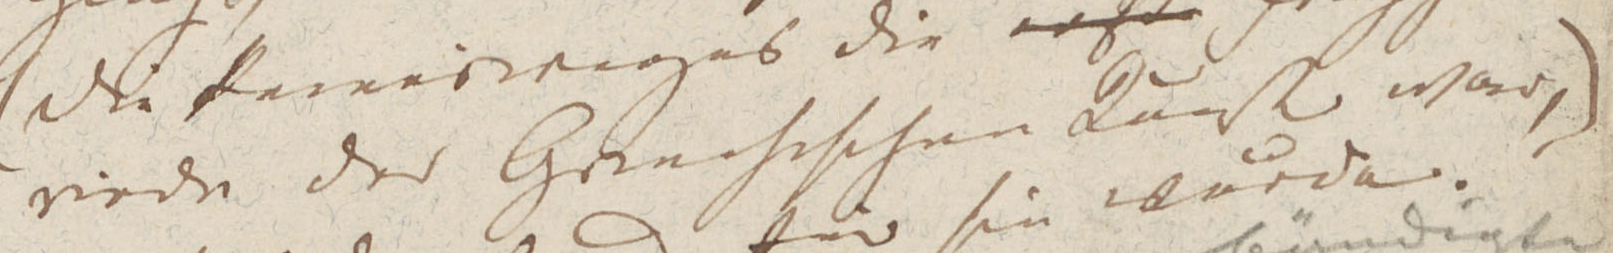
riode der Griechischen Kunst war,)
